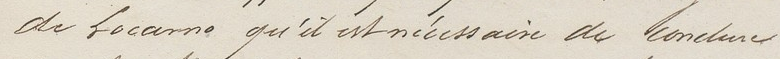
de Locarno qu'il est nécessaire de conclure
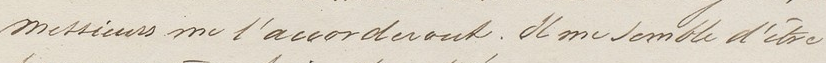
Messieurs me l'accorderont. Il me semble d'être
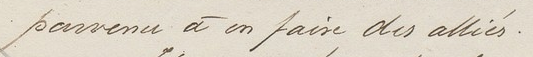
parvenu à en faire des alliés.
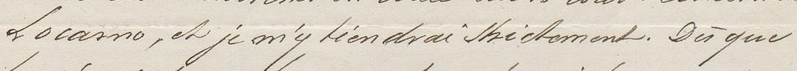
Locarno, et je m'y tiendrai strictement. Dès que
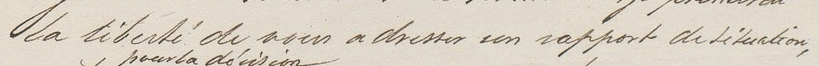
la liberté de vous adresser un rapport de situation,
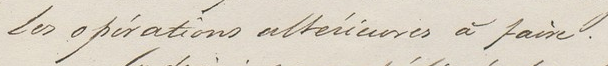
les opérations ultérieures à faire.
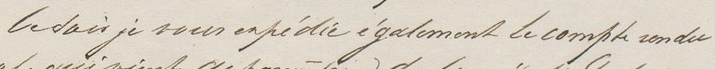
Ce soir je vous expédie également le compte rendu
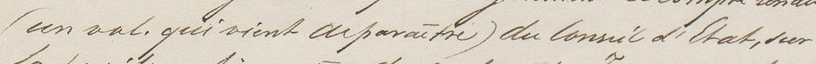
(un vol. qui vient de paraître) du Conseil d'Etat, sur
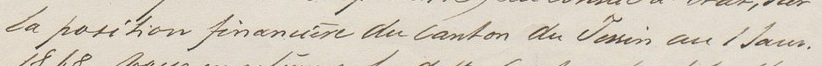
la position financière du Canton du Tessin au 1 Janv.
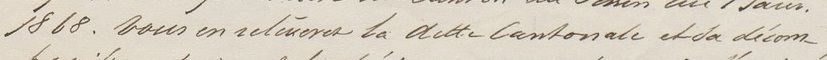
1868. Vous en reléverez la dette Cantonale et sa décom-
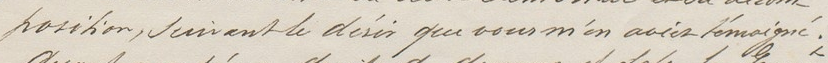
position, suivant le désir que vous m'en aviez témoigné.
